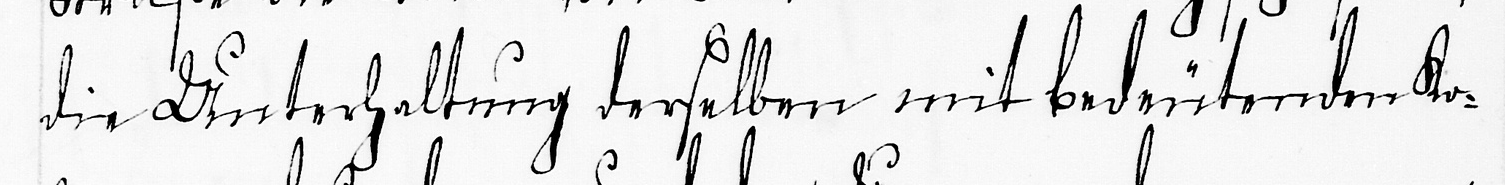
die Unterhaltung derselben mit bedeutenden Ko¬
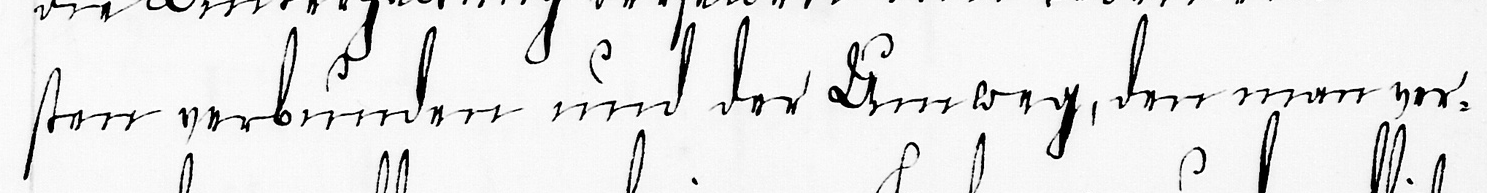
sten verbunden und der Umweg, den man ver¬
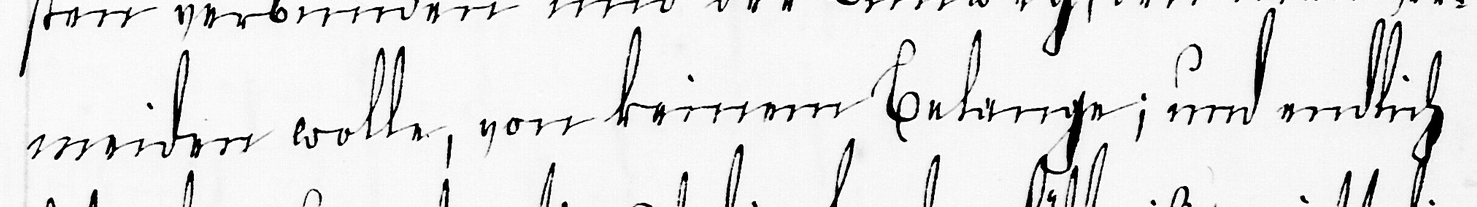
meiden wolle, von keinem Belange; und endlich
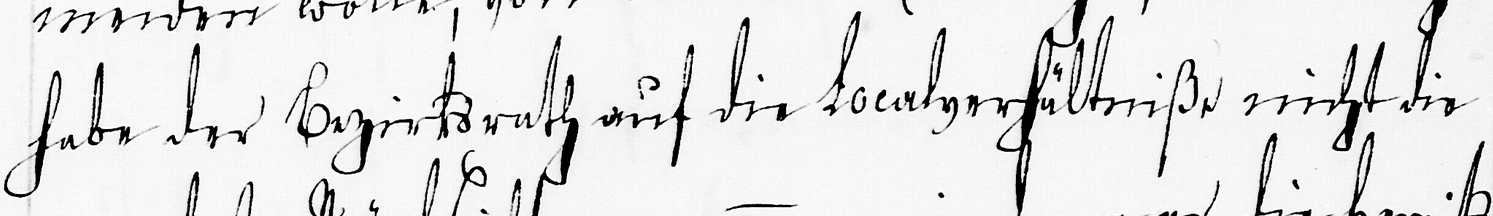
habe der Bezirksrath auf die Localverhältniße nicht die
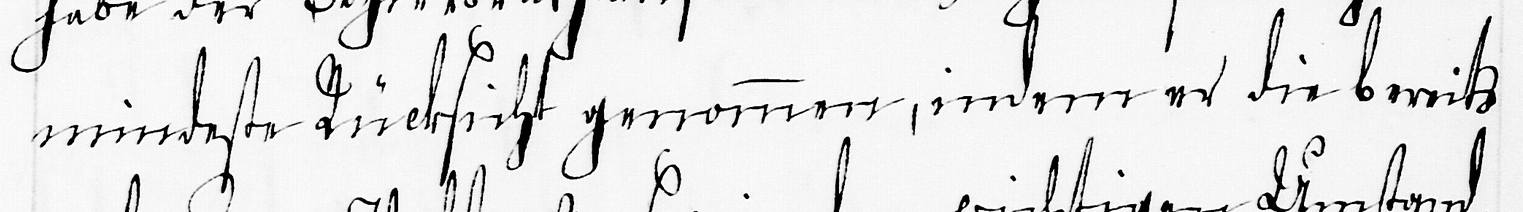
mindeste Rücksicht genommen, indem er die bereits
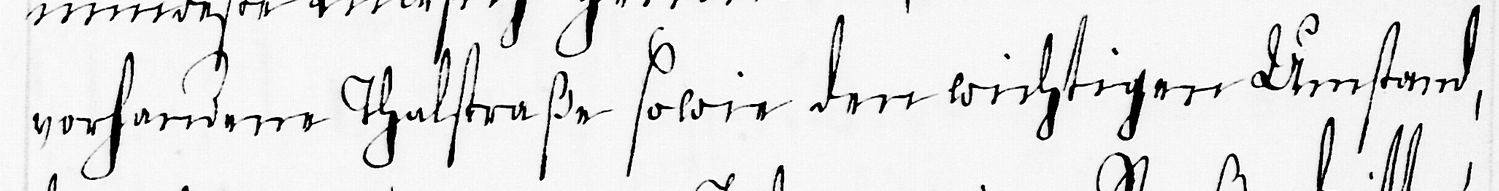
vorhandene Thalstraße sowie den wichtigen Umstand,
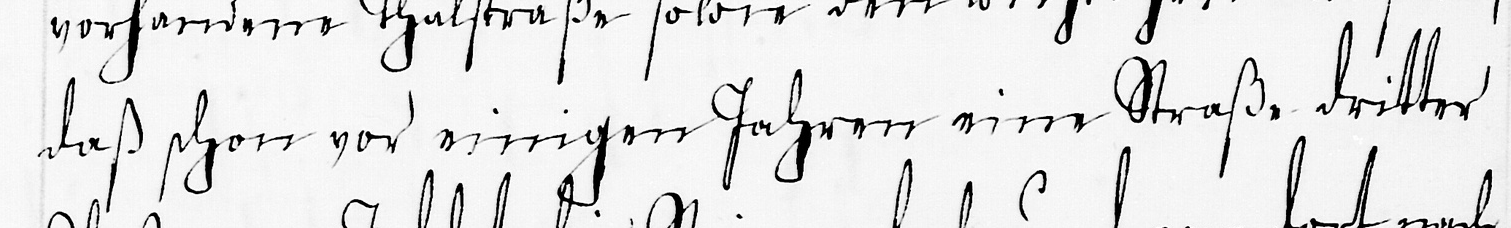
daß schon vor einigen Jahren eine Straße dritter
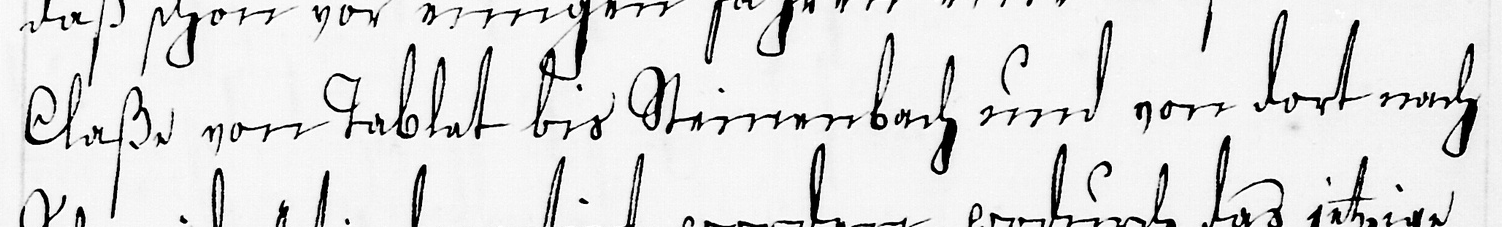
Claße von Tablat bis Steinenbach und von dort nach
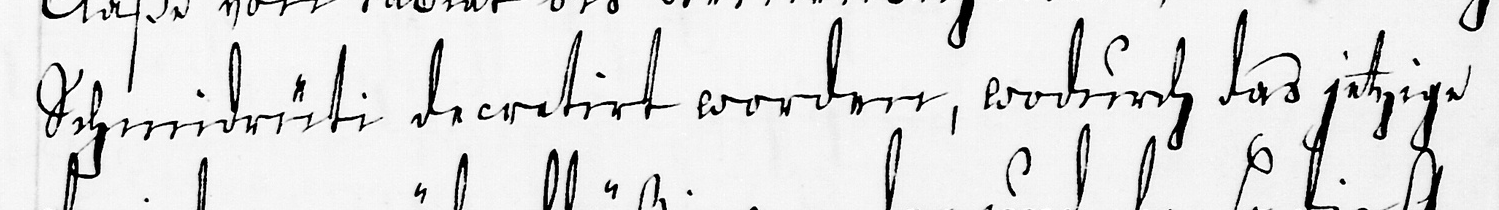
Schmidrüti decretirt worden, wodurch das jetzige
